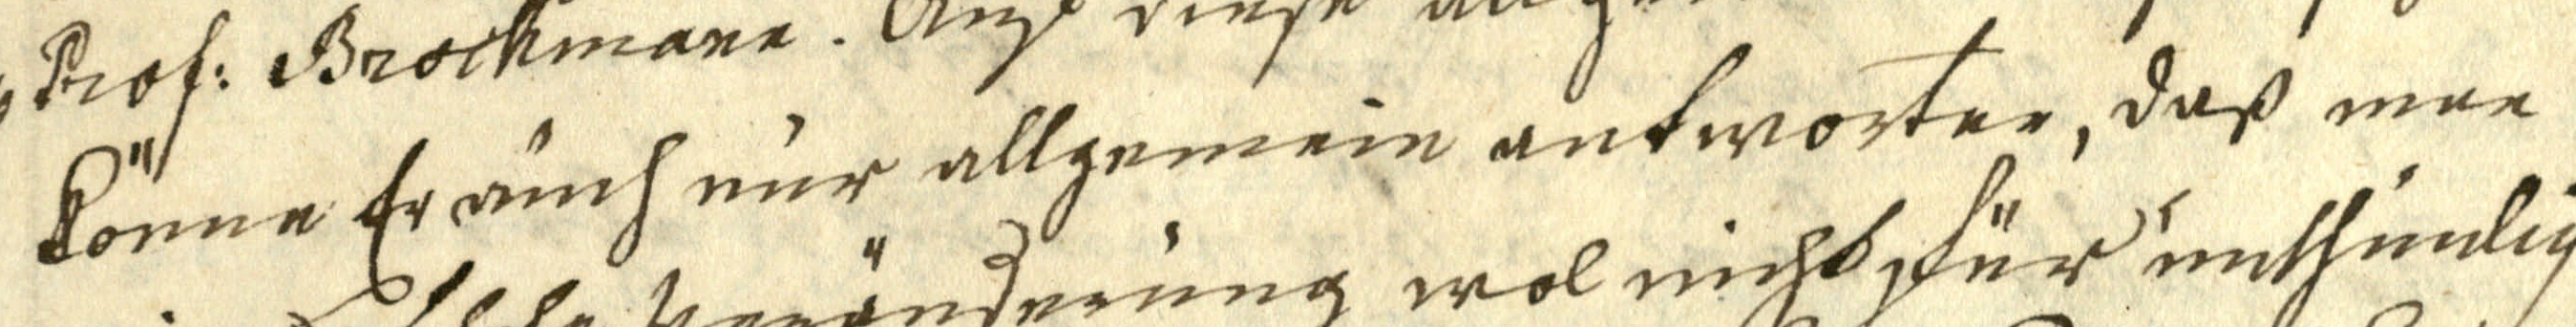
könne Er auch nur allgemein antworten, daß man
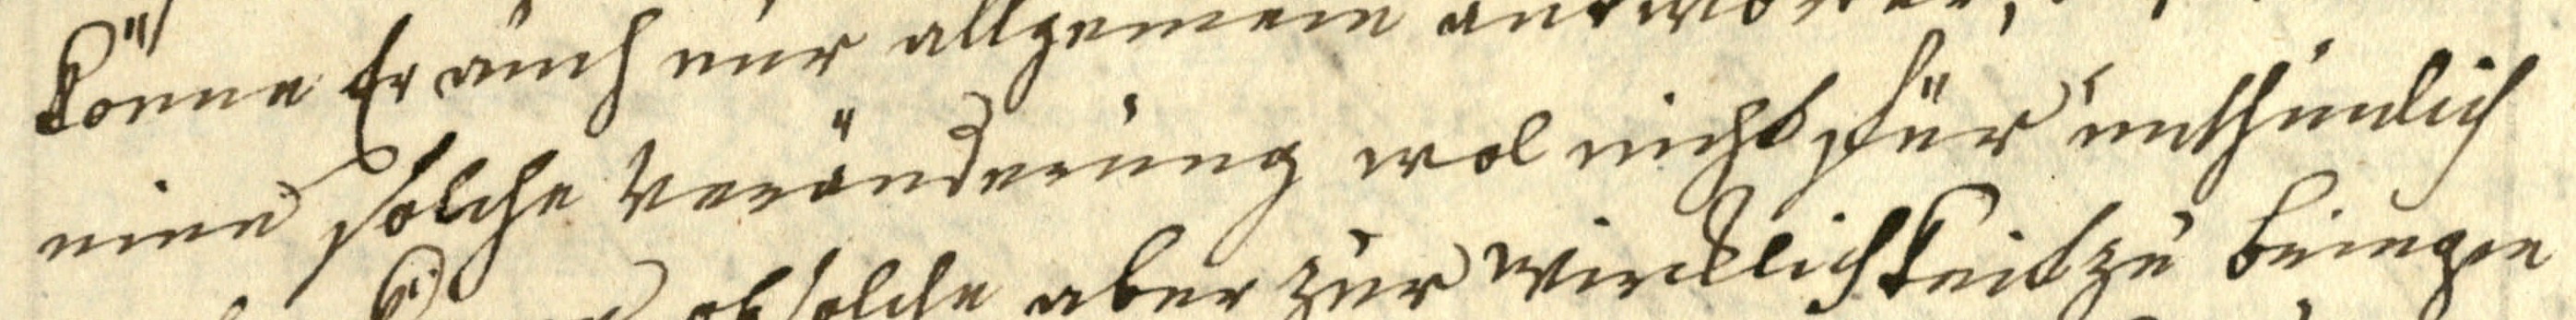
eine solche Veränderung wol nicht für unthunlich
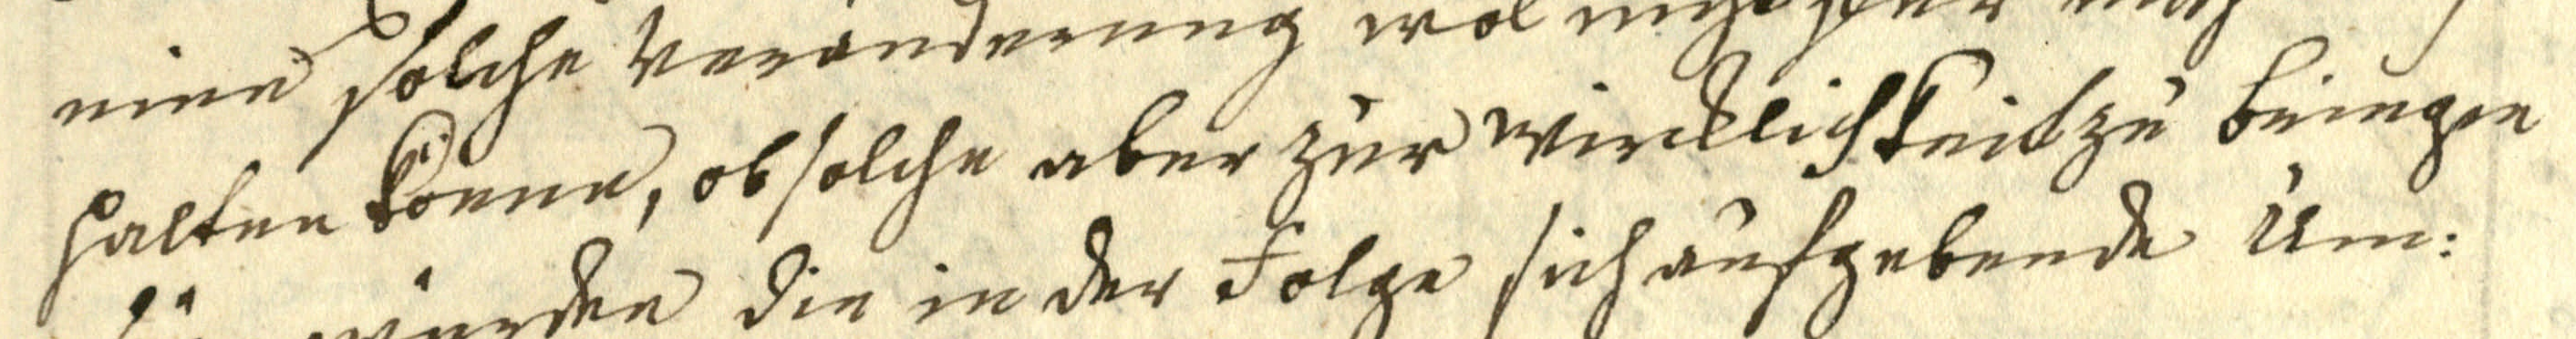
halten könne, ob solche aber zur Wircklichkeit zu bringen
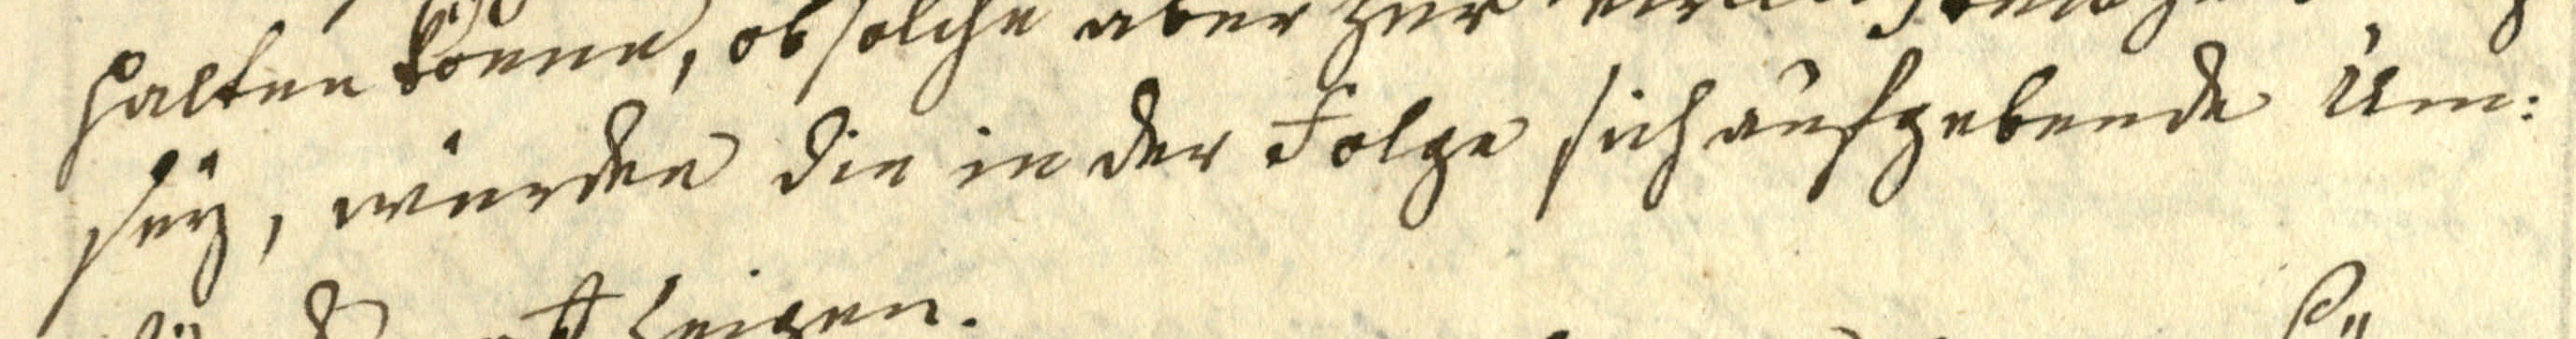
seÿ, würden die in der Folge sich aufgebende Um¬
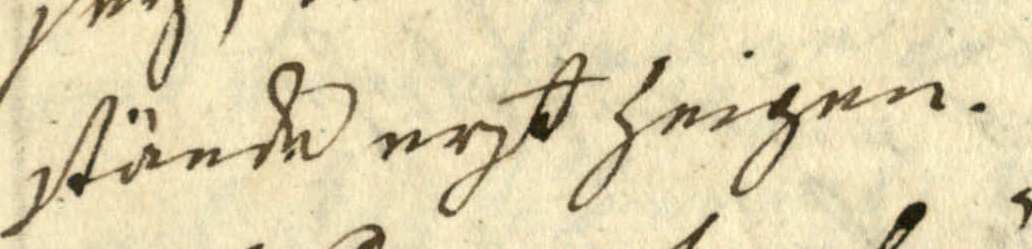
stände erst zeigen.
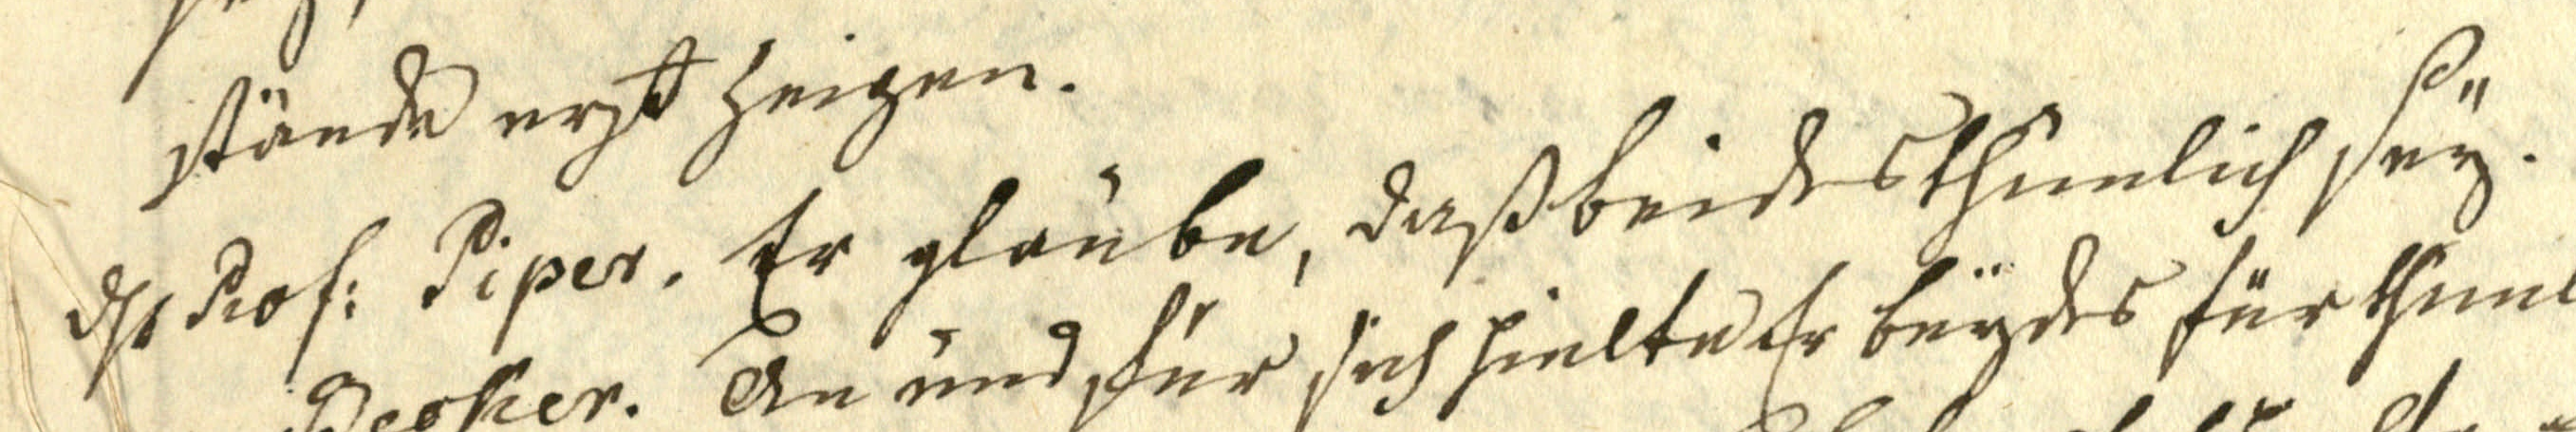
dh Prof. Piper. Er glaube, daß beides thunlich seÿ.
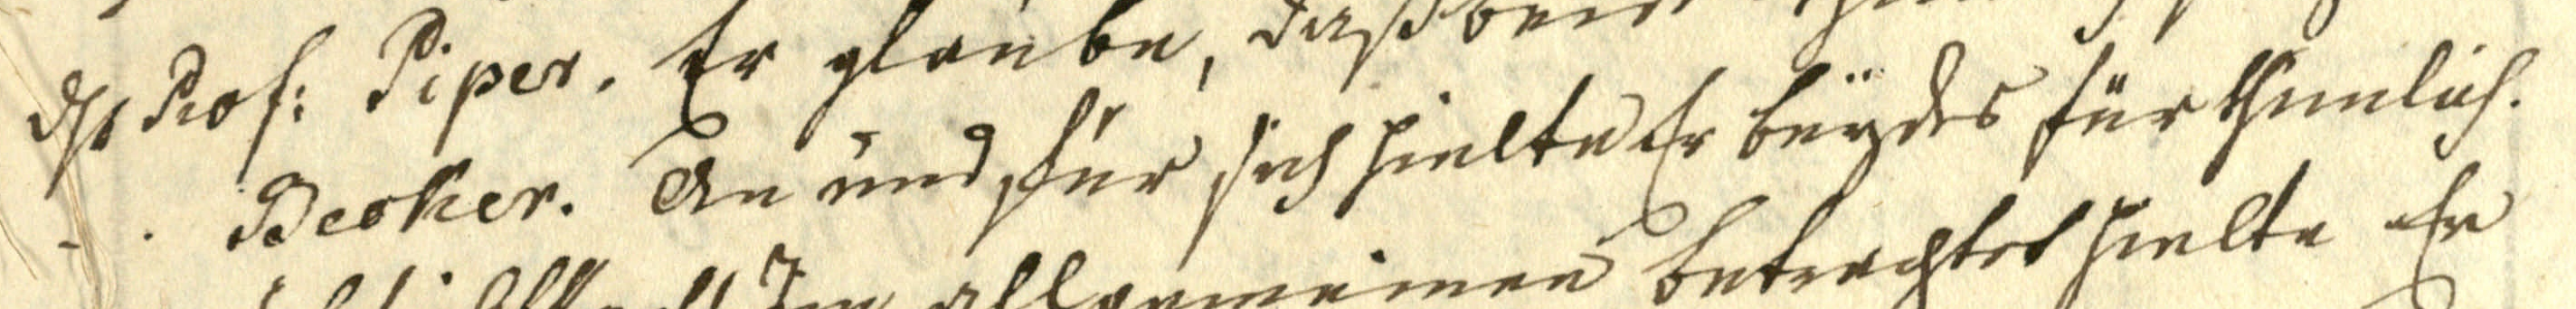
Becker. An und für sich hielte Er beÿdes für thunlich.
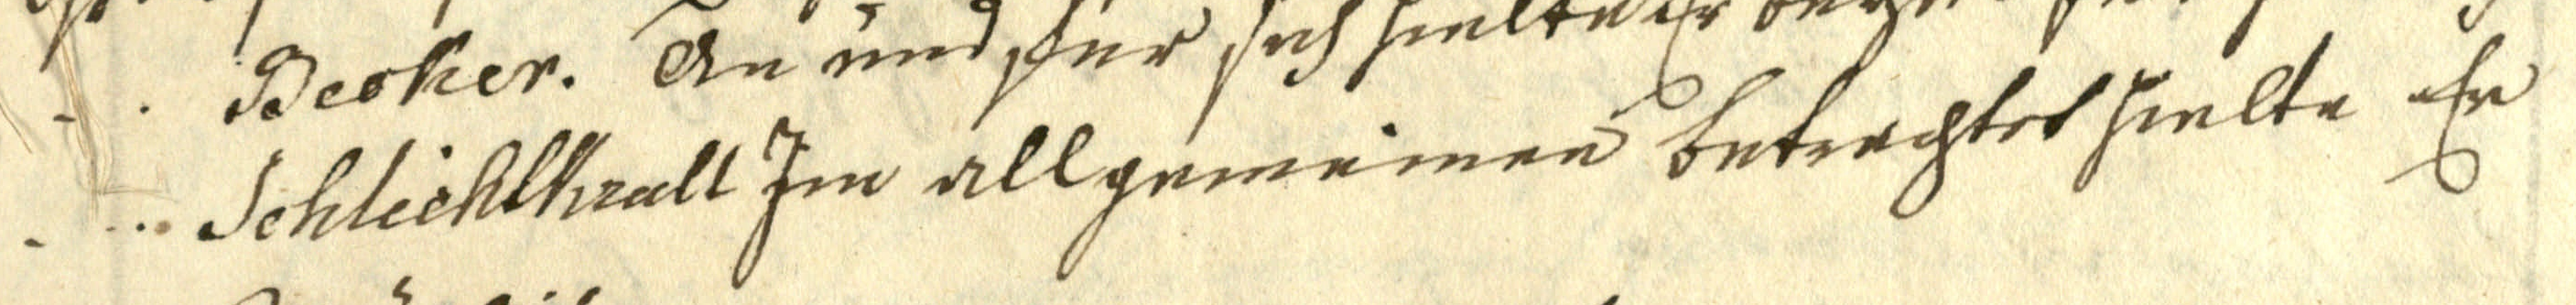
Schlichtkrull Im allgemeinen betrachtet hielte Er
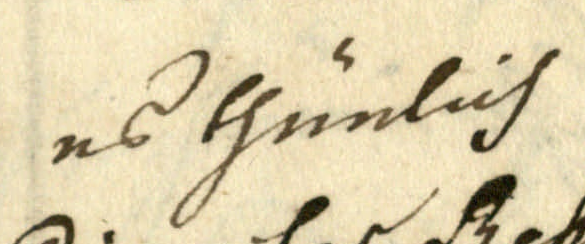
es thunlich
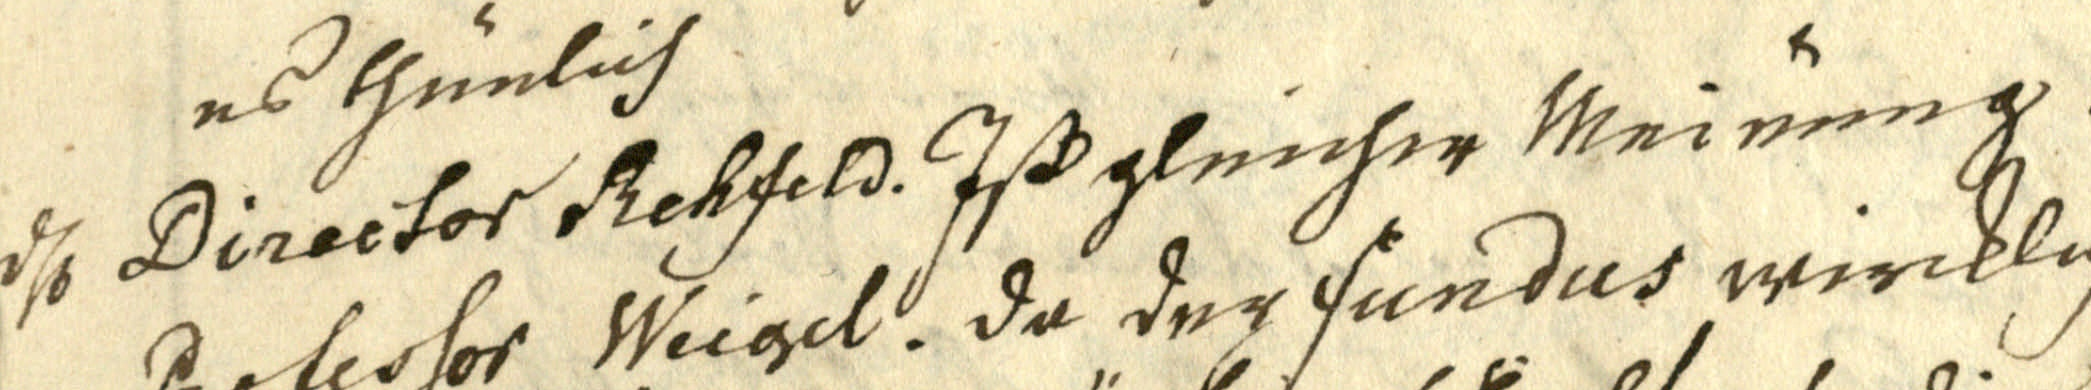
dh. Director Rehfeld. Ist gleicher Meinung.
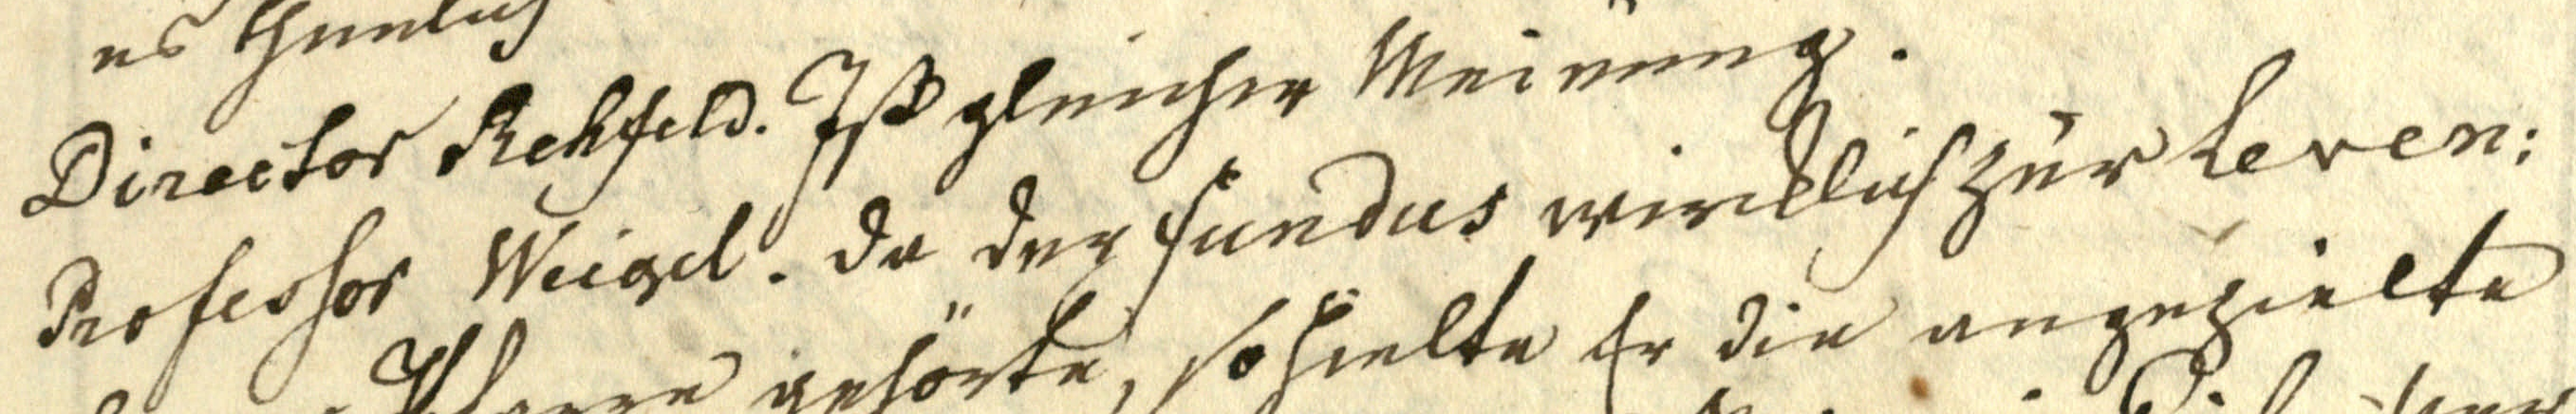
Professor Weigel. Da der Fundus wircklich zur Leven¬
